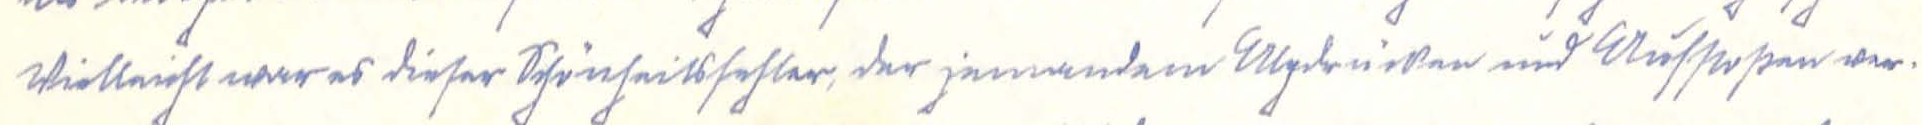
Vielleicht war es dieser Schönheitsfehler, der jemandem Alpdrücken und Aufstoßen ver-
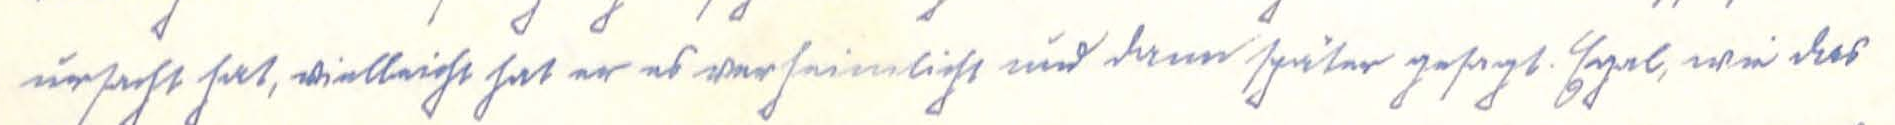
ursacht hat, vielleicht hat er es verheimlicht und dann später gesagt. Egal, wie das
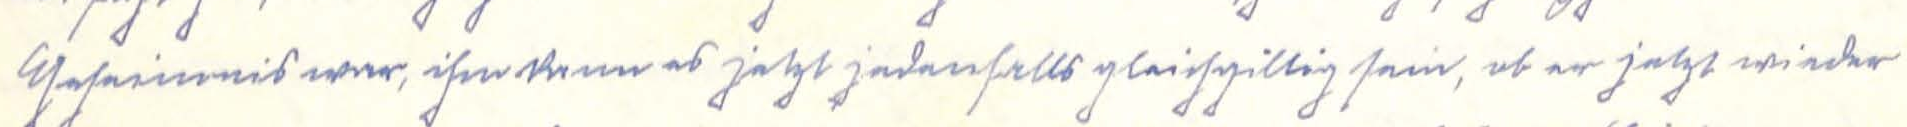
Geheimnis war, ihm kann es jetzt jedenfalls gleichgültig sein, ob er jetzt wieder
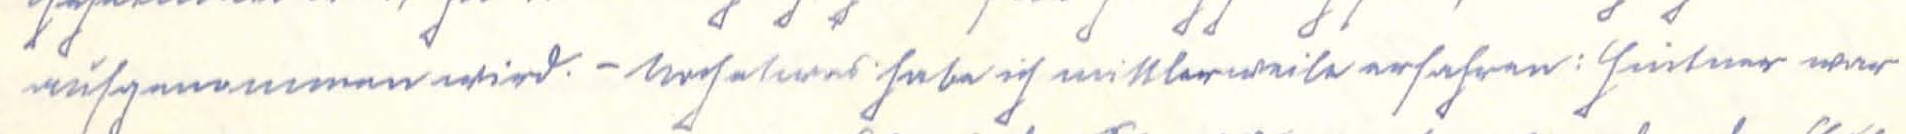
aufgenommen wird. - Noch etwas habe ich mittlerweile erfahren: Hintner war
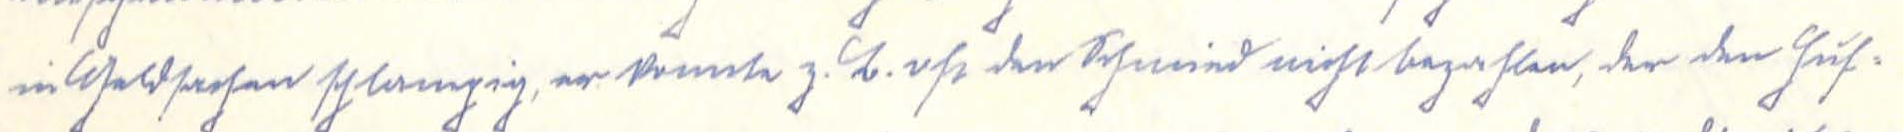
in Geldsachen schlampig, er konnte z. B. oft den Schmied nicht bezahlen, der den Huf-
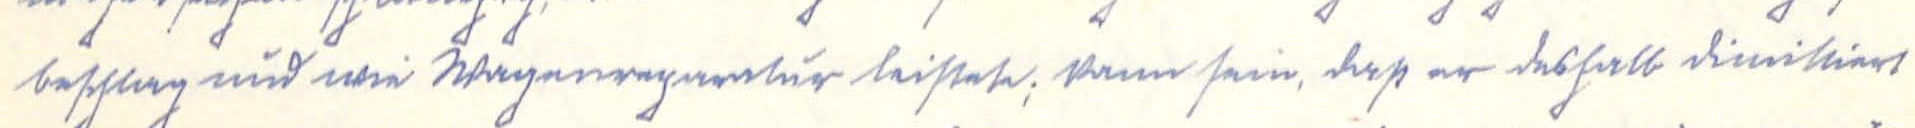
beschlag und eine Wagenreparatur leistete; kann sein, daß er deshalb dimittiert
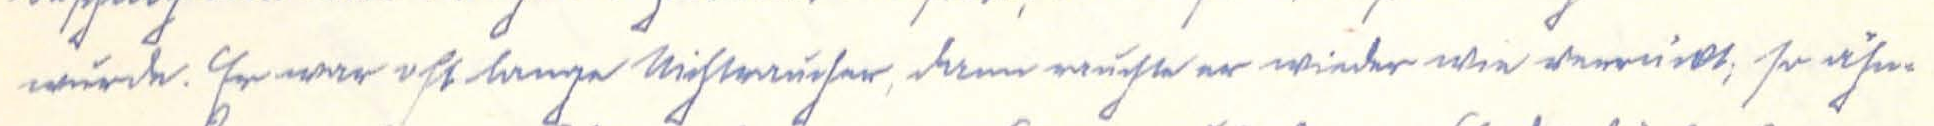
wurde. Er war oft lange Nichtraucher dann rauchte er wieder wie verrückt; so ähn-
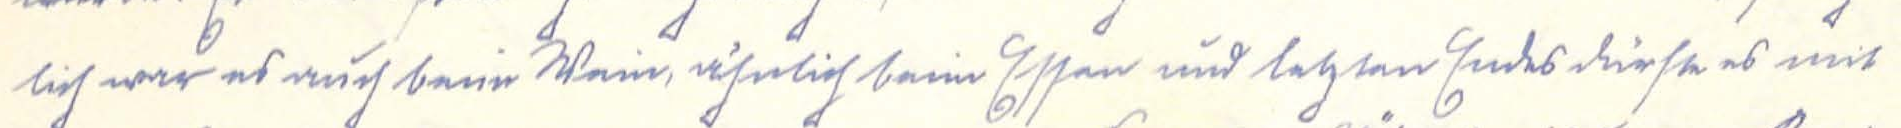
lich war es auch beim Wein, ähnlich beim Essen und letzten Endes dürfte es mit
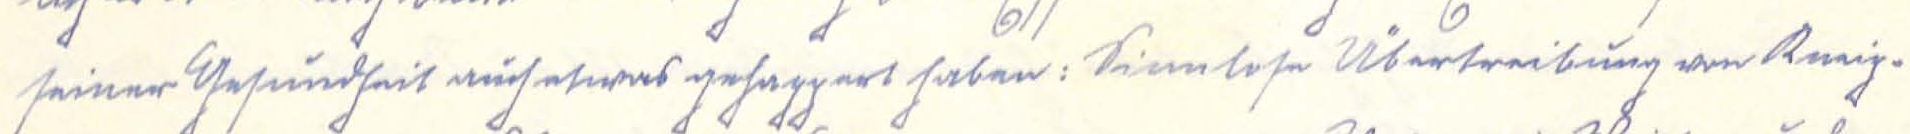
seiner Gesundheit auch etwas gehappert haben: Sinnlose Übertreibung von Kneip-
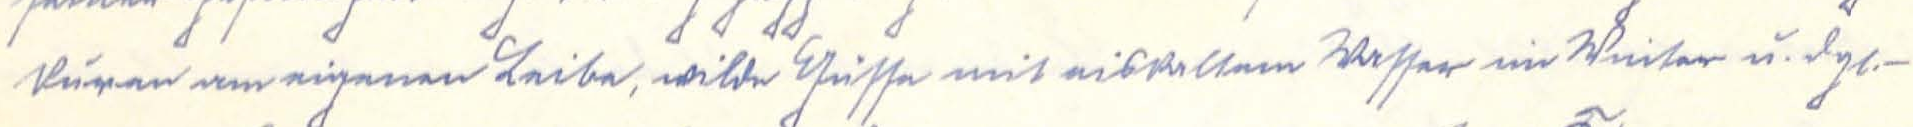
kuren am eigenen Leibe, wilde Güsse mit eiskaltem Wasser im Winter u. dgl.-
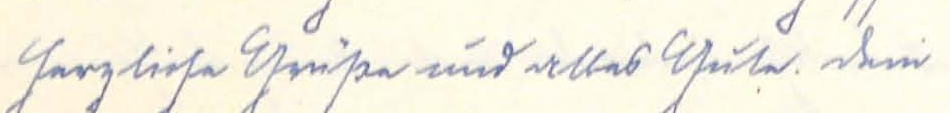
Herzliche Grüße und alles Gute dein
